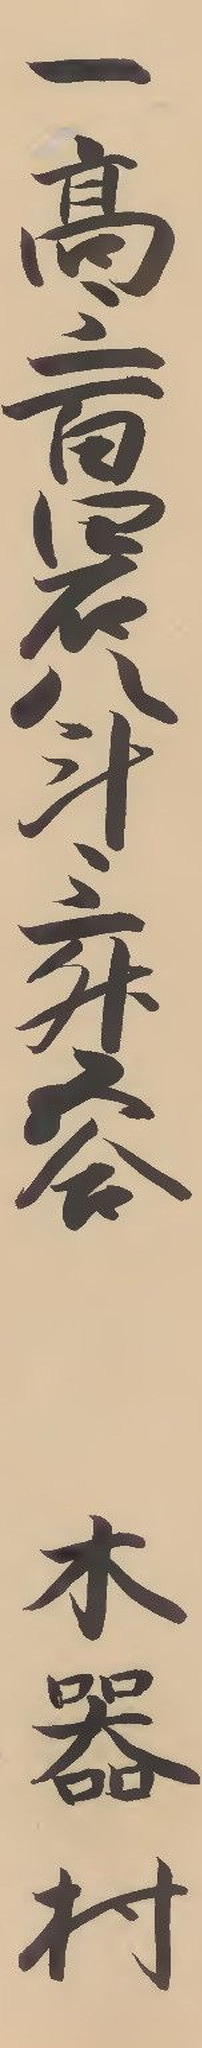一高三百四石八斗三升五合木器村
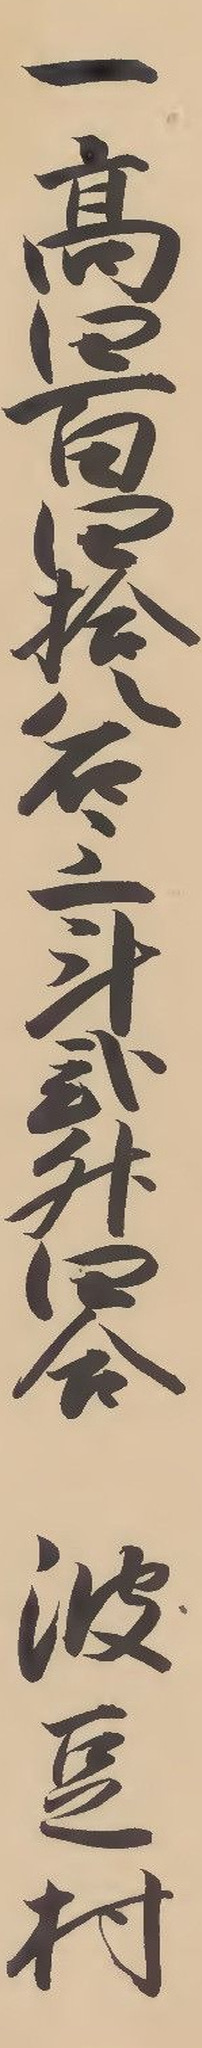一高四百四拾八石三斗弐升四合波豆村
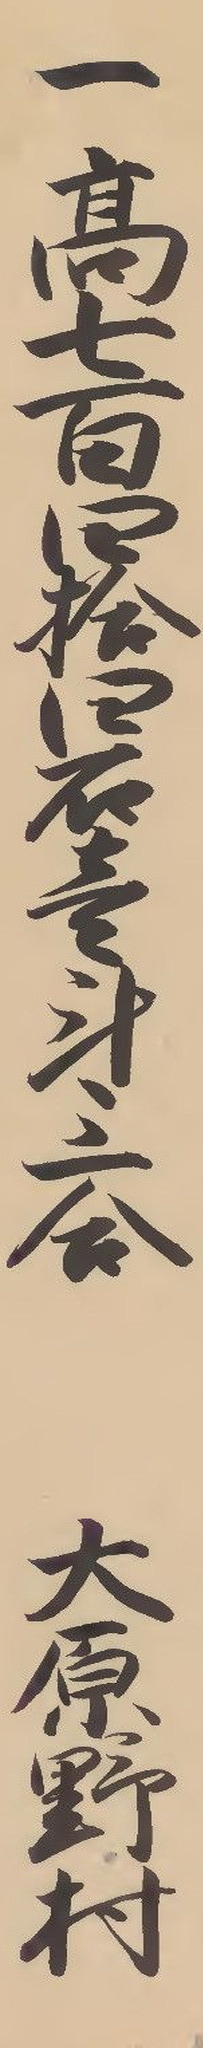一高七百四拾四石壱斗三合大原野村

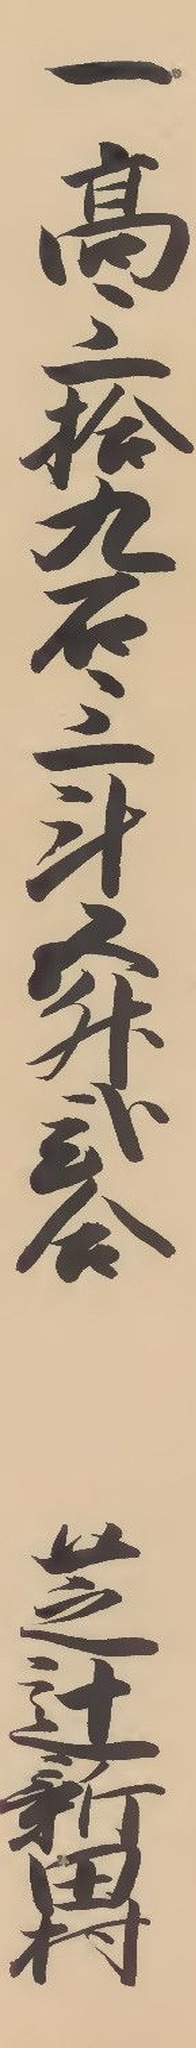一高三拾九石三斗五升弐合芝辻新田村
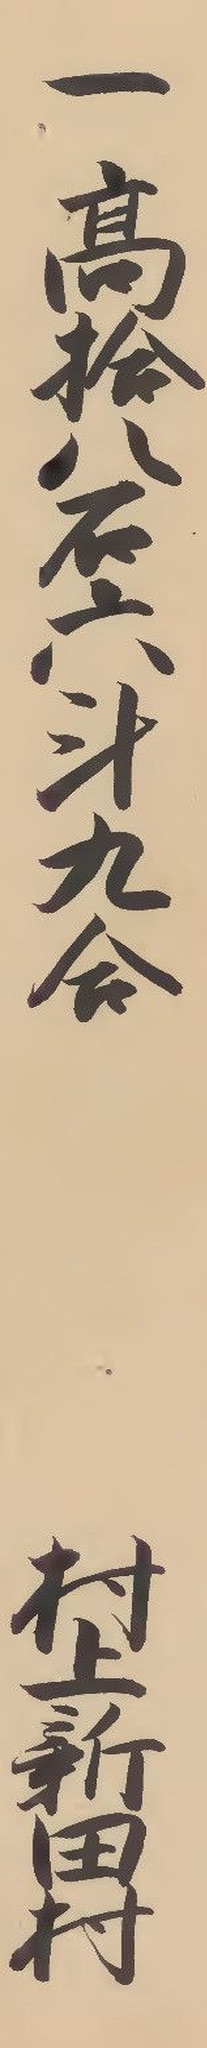一高拾八石六斗九合村上新田村
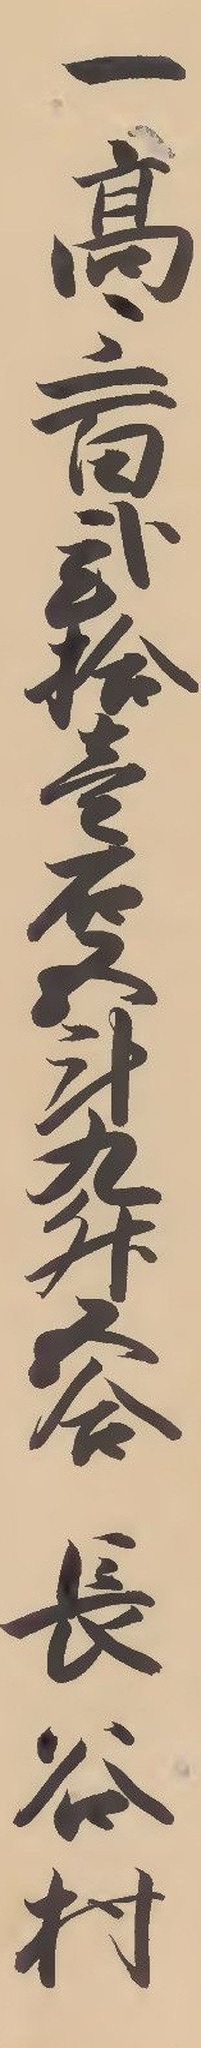一高三百弐拾壱石五斗九升五合長谷村
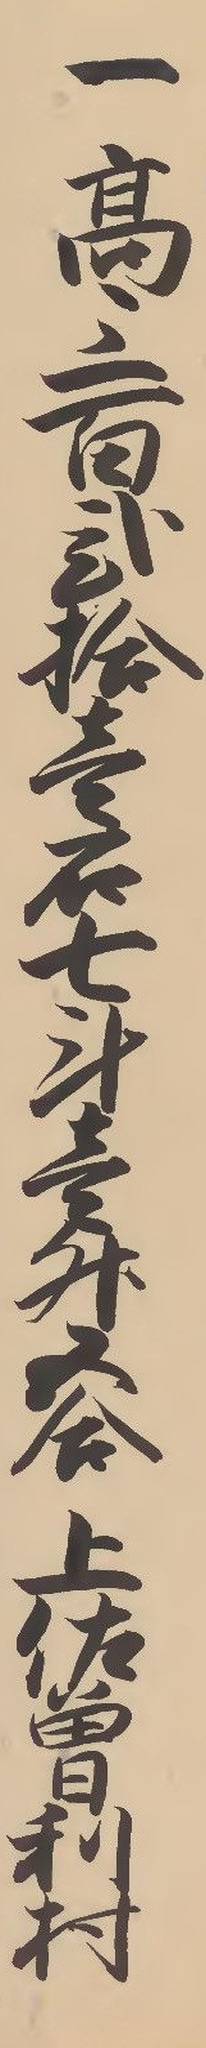一高三百弐拾壱石七斗壱升五合上佐曽利村
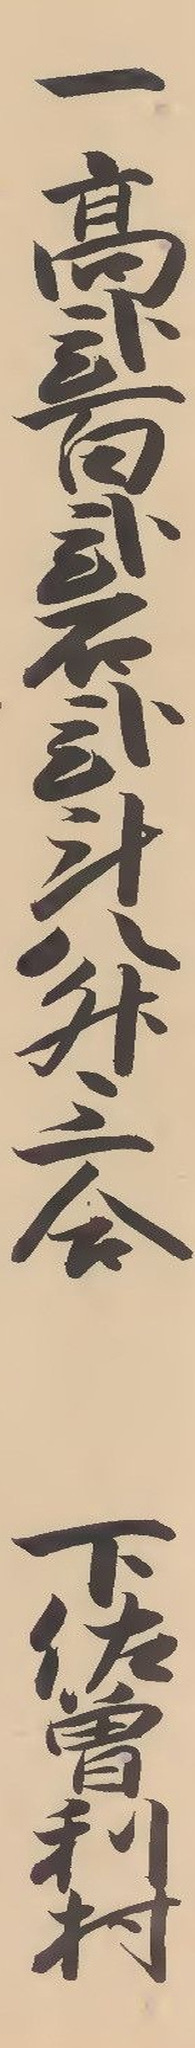一高弐百弐石弐斗八升三合下佐曽利村
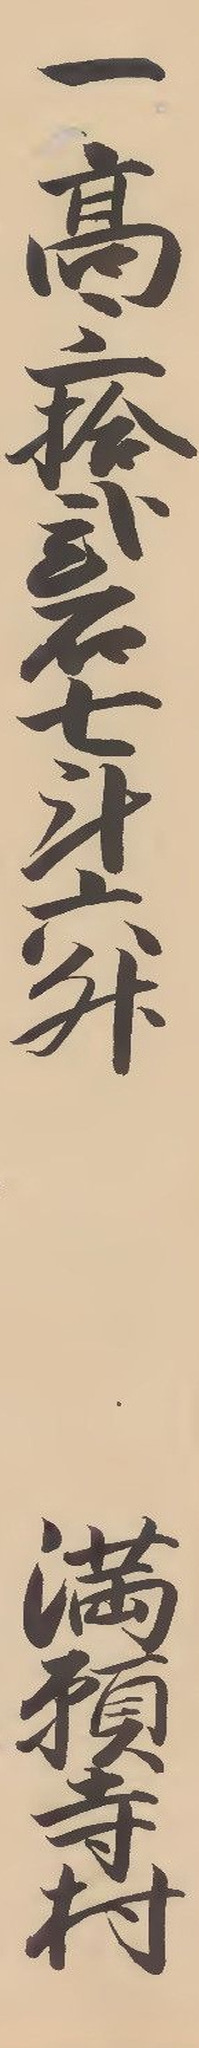一高三拾弐石七斗六升満願寺村
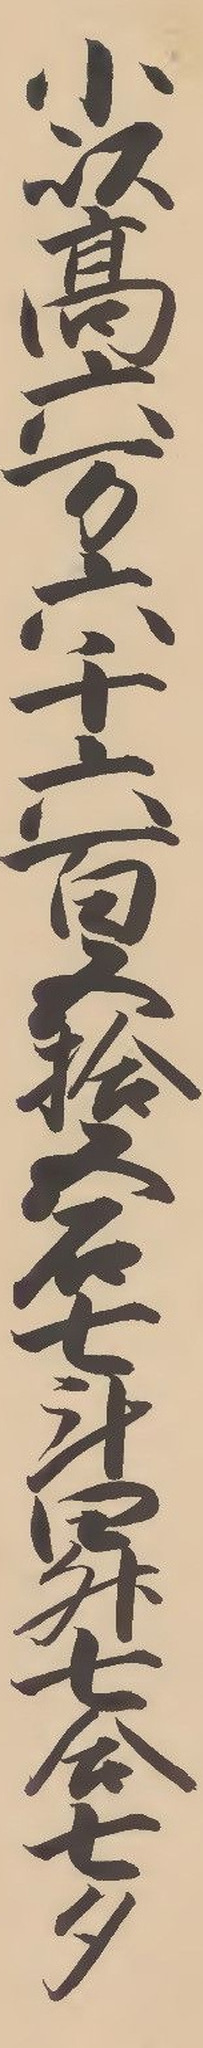小以高六万六千六百五拾五石七斗四升七合七勺

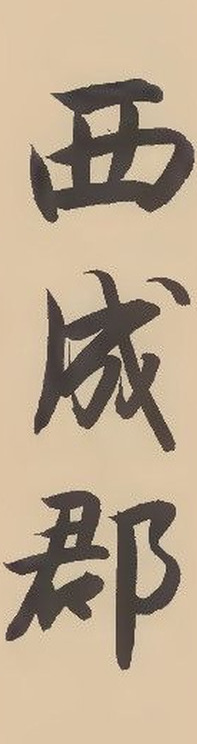西成郡
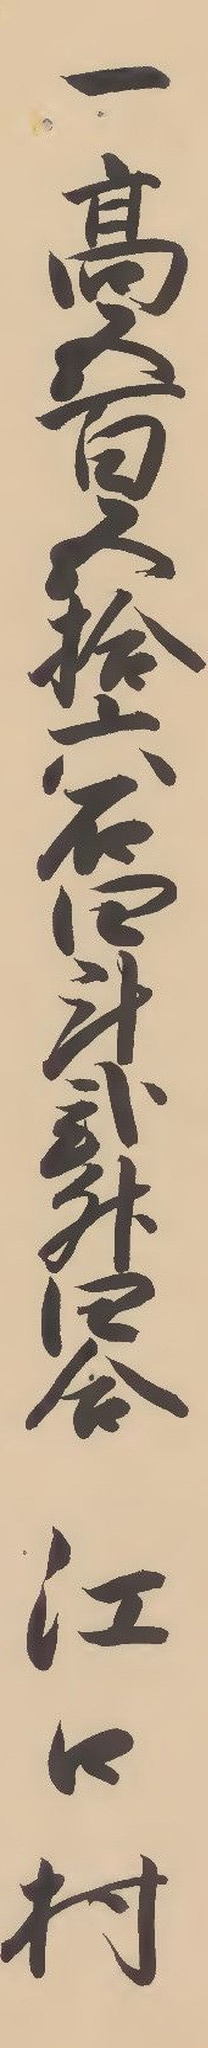一高五百五拾六石四斗弐升四合江口村
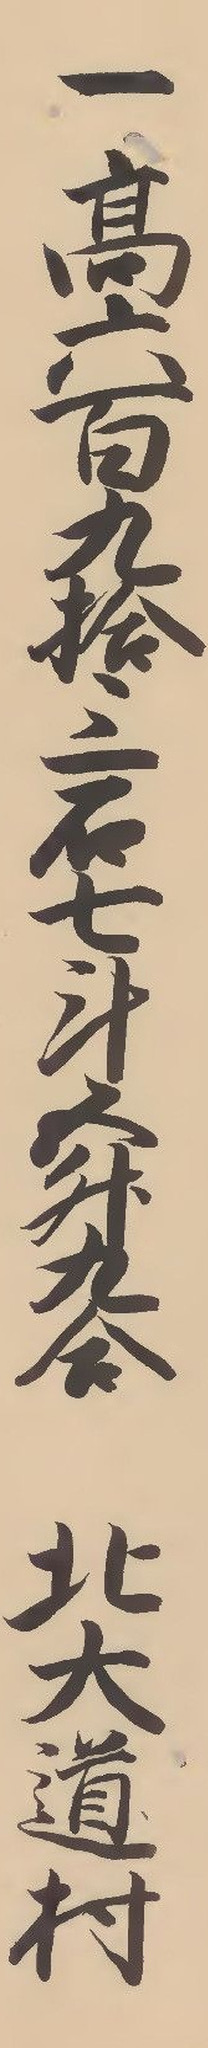一高六百九拾三石七斗五升九合北大道村
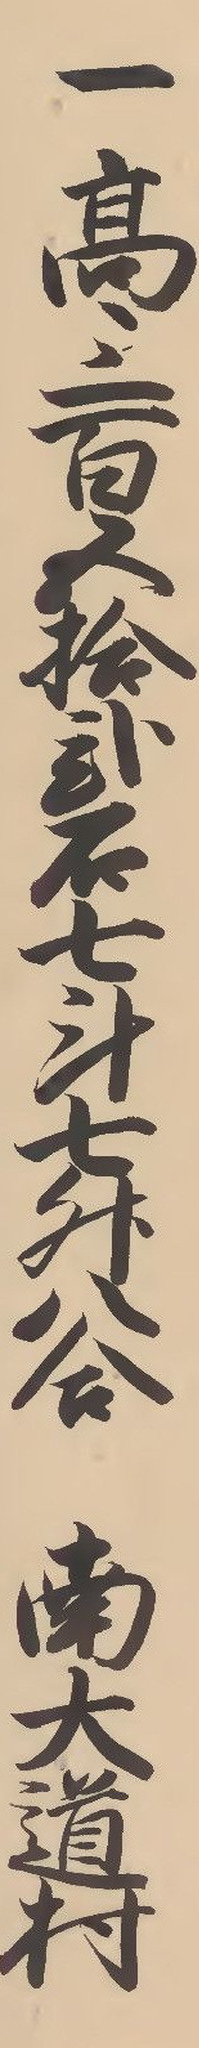一高三百五拾弐石七斗七升八合南大道村
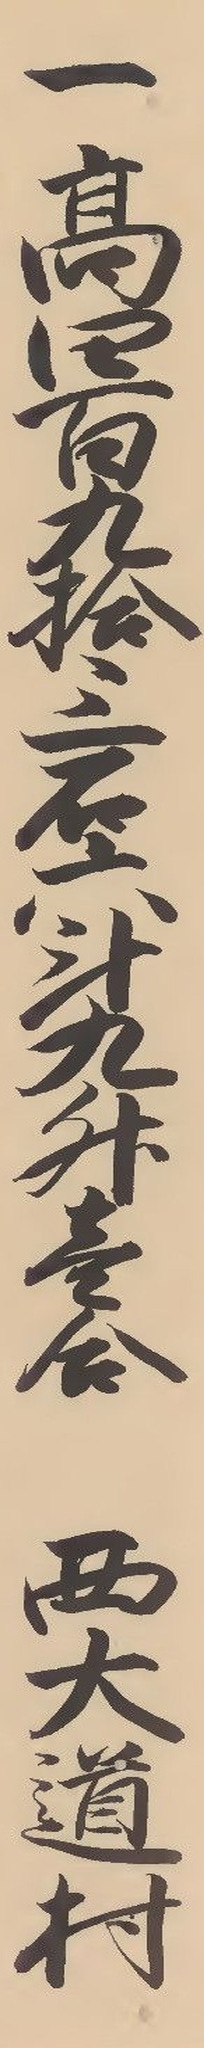一高四百九拾三石六斗九升壱合西大道村
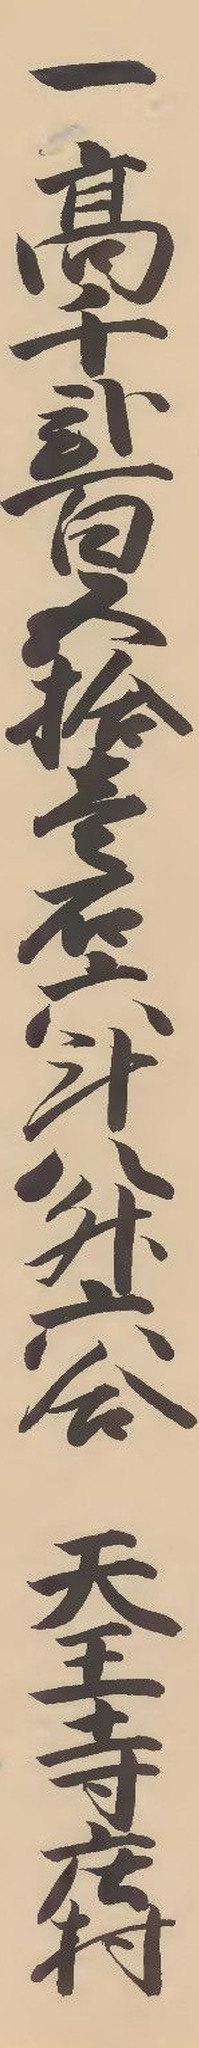一高千弐五拾壱石六斗八升六合天王寺庄村
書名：摂津国郷帳
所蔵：国立公文書館 National Archives of Japan
